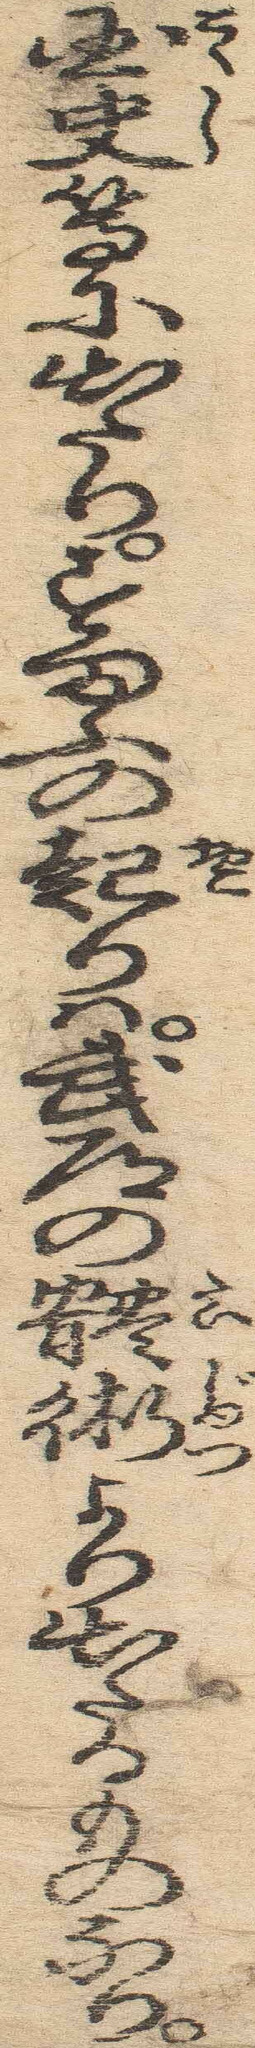国史等に出たり。すまふの起りは。武道の体術より出たるものなり。
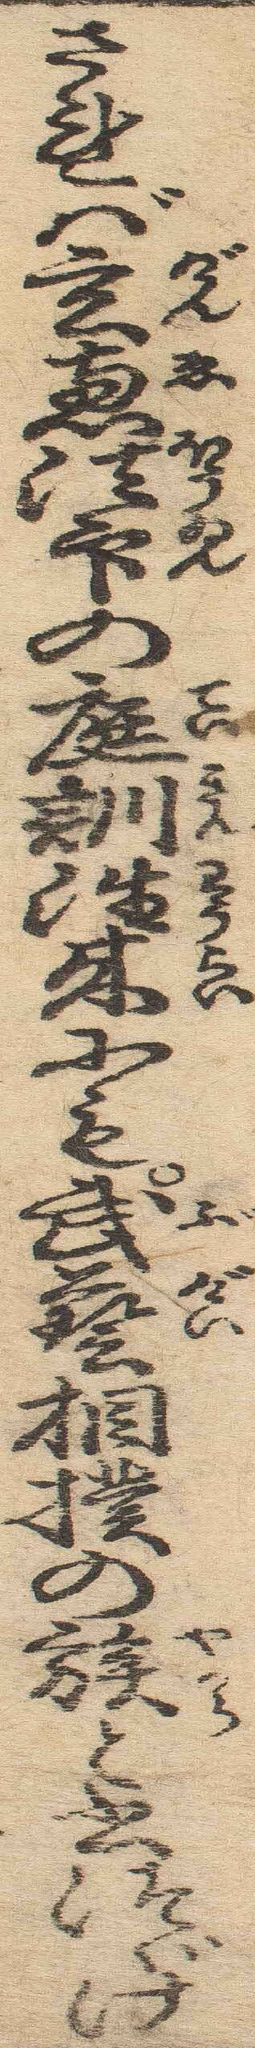されば玄恵法印の庭訓往来にも。武芸相撲の族と書つゞけ
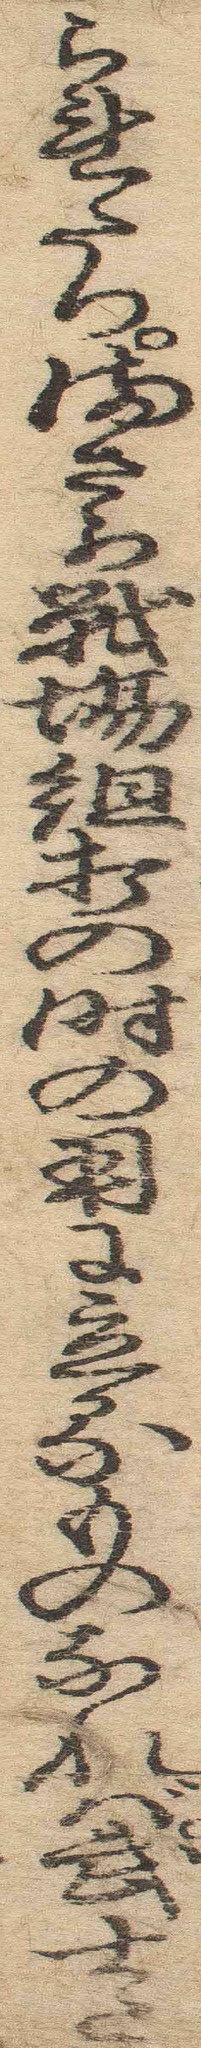られたり。まさか戦場組打の時の用に立るものなれば。武士た
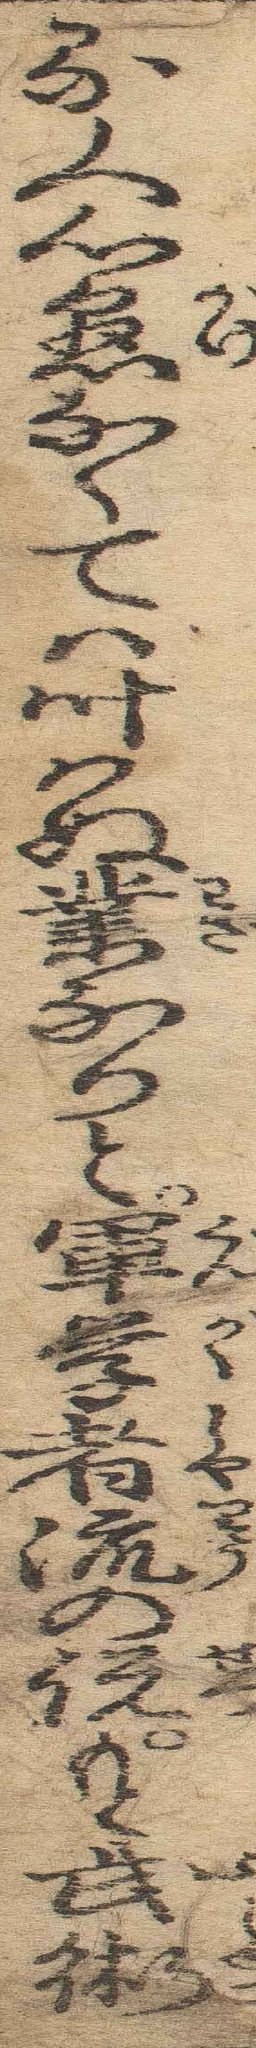る人心懸なくては叶はぬ業なりと。軍学者流の説。もゝ武術

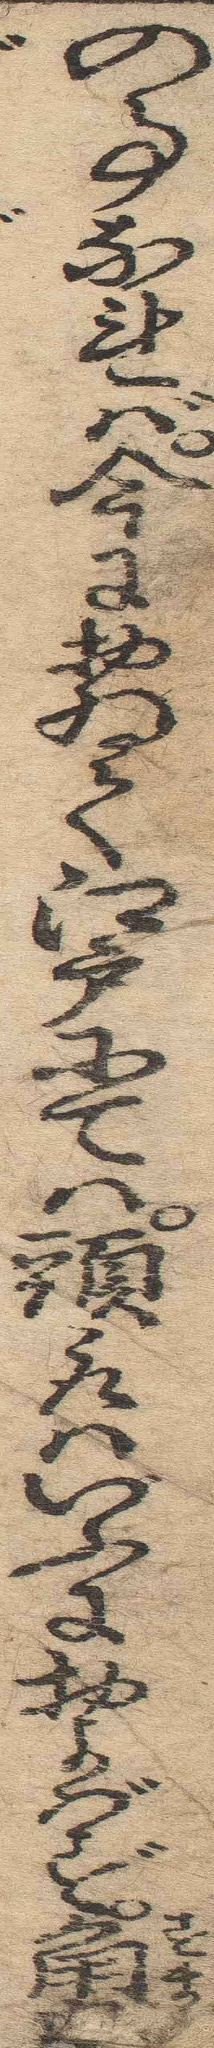の事なれば。今におゐて江戸にては。頭取はいふにおよばず角力
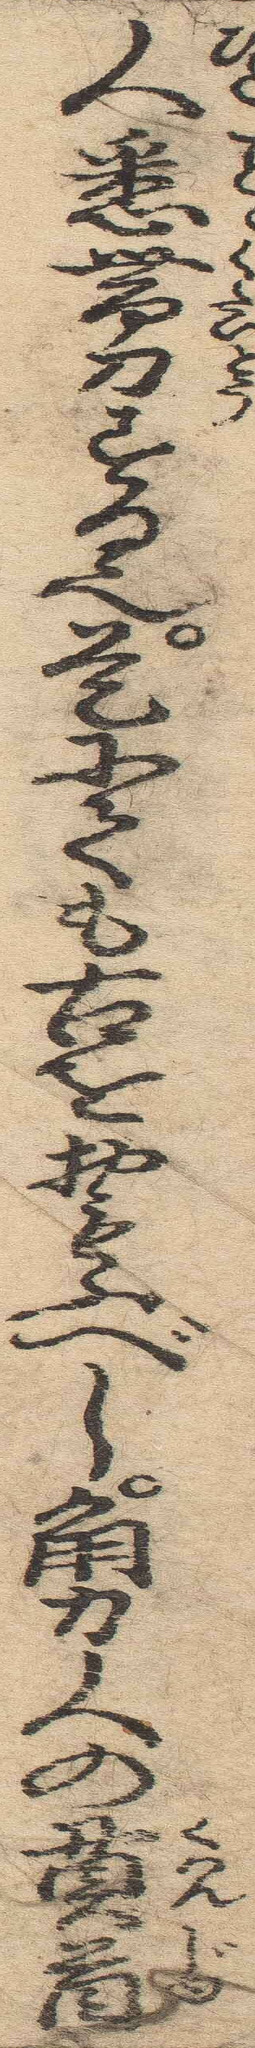人悉帯刀する也。是にても古をおもふべし。角力人の貫首
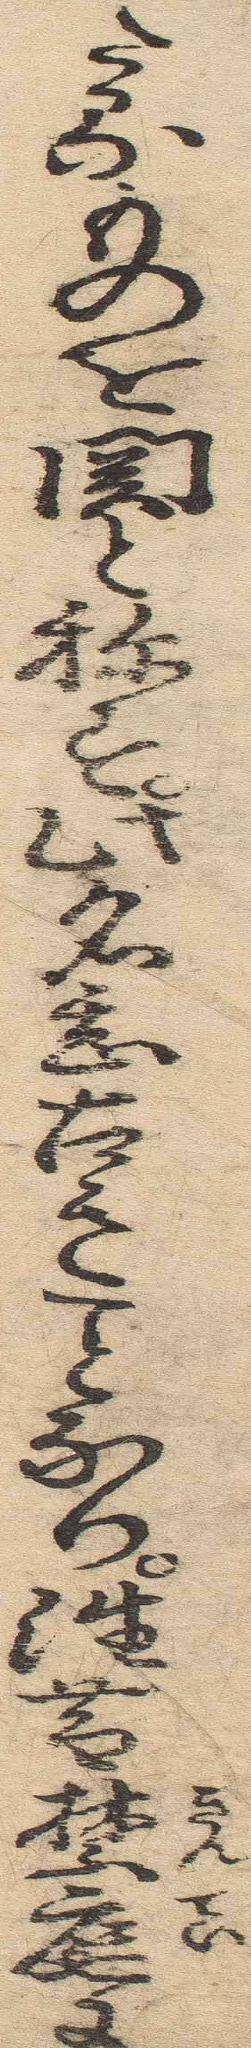たるものを関と称す。此名甚古きことなり。往古禁庭に
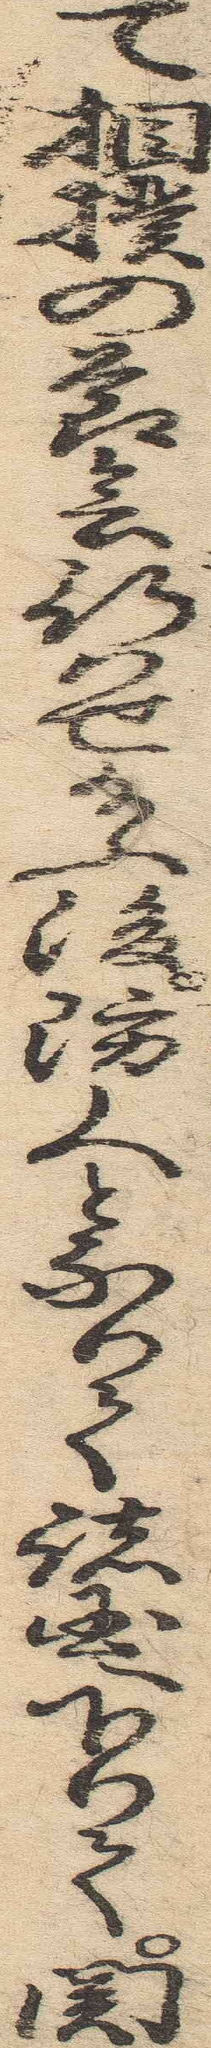て相撲の節会行はせ給ふ後。防人となつて諸国へ下りて。関
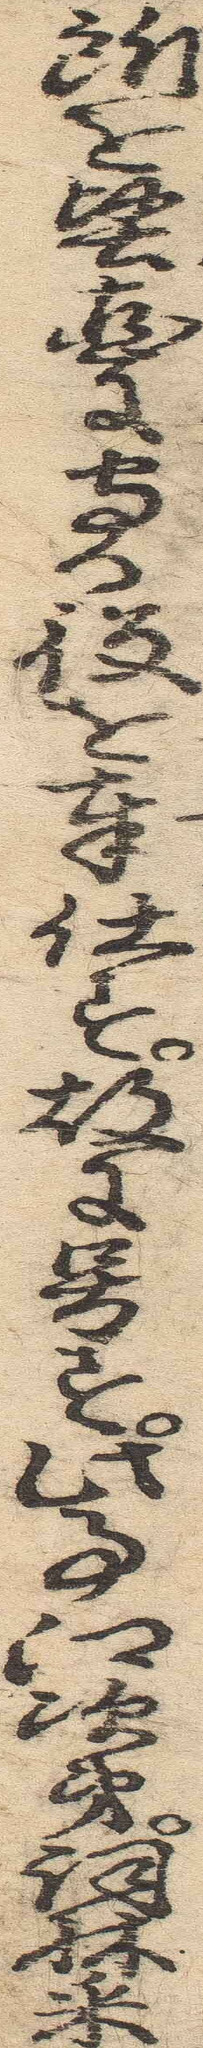所を堅固に守る役を奉仕す。故に号す。此事江次第。詞林采
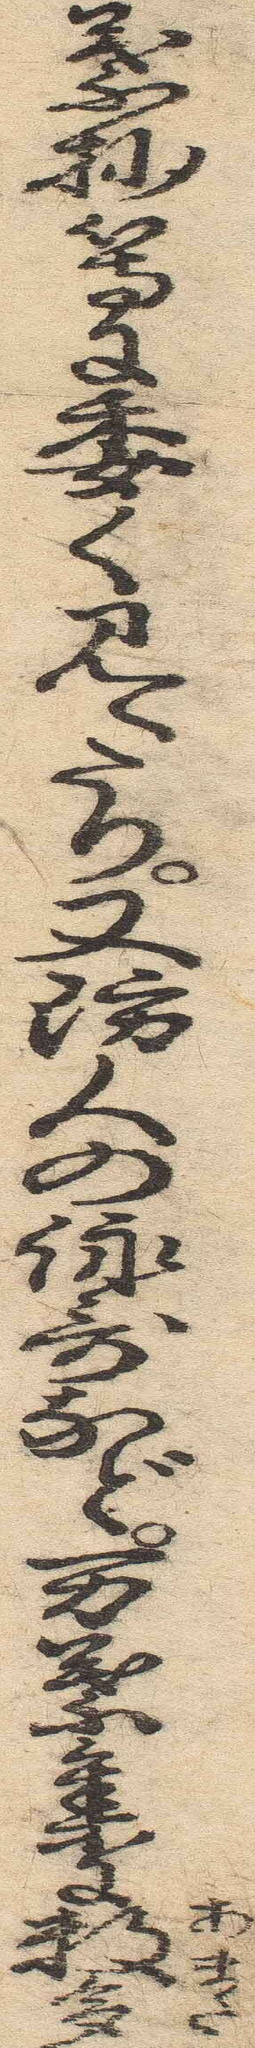葉抄等に委く見へたり。又防人の詠哥など。万葉集に数多
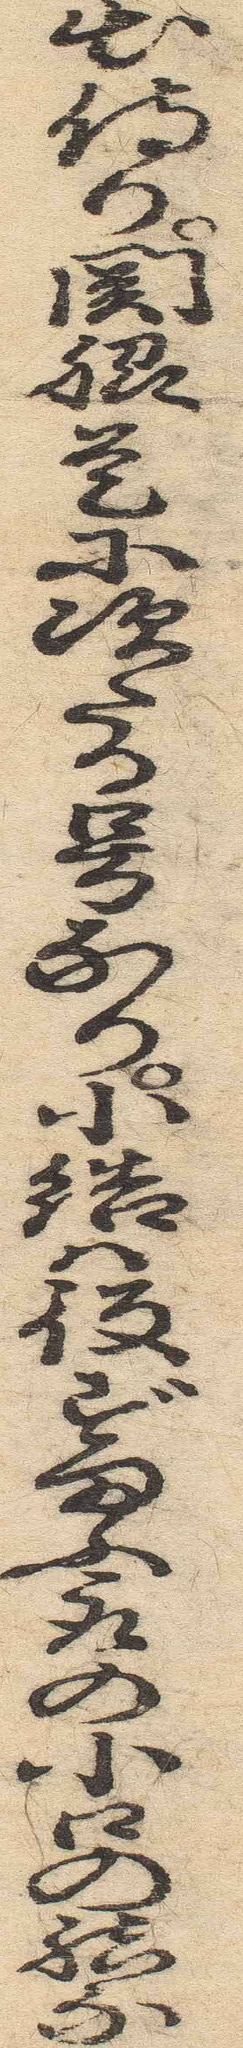出侍り。関脇是に次たる号なり。小結は役ずまふ取の小口の結な
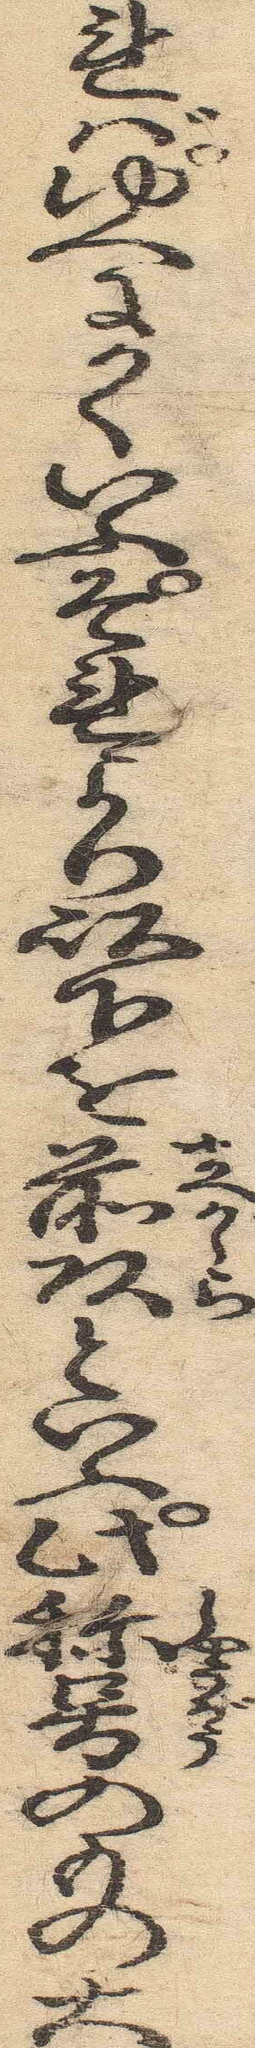れば。ゆへにかくいふ。それより以下を前頭といふ。此称号のもの大
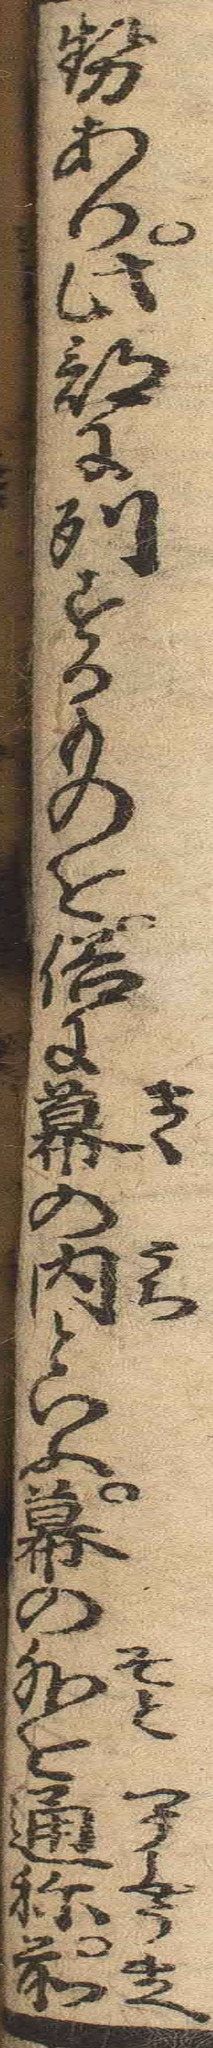勢あり。此部に列するものを。俗に幕の内といふ。幕の外を通称。前
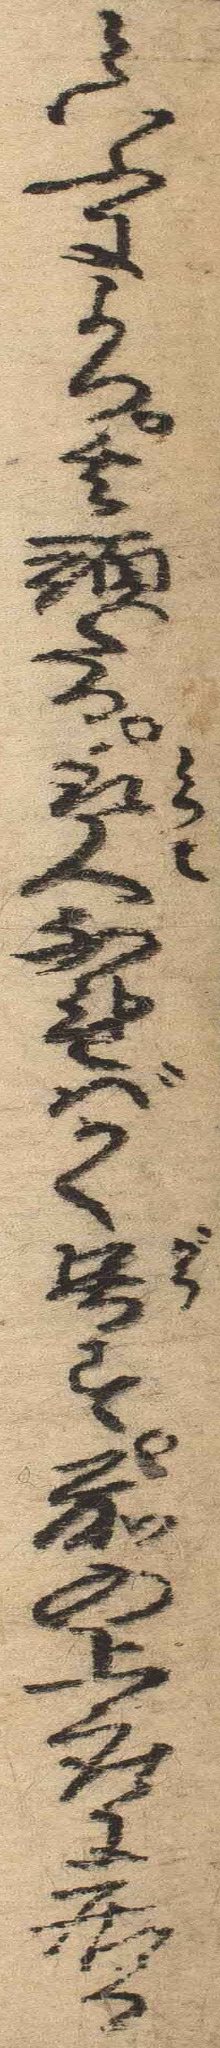といふにより。其頭たる。取人なればかく号す。前の上座に居る
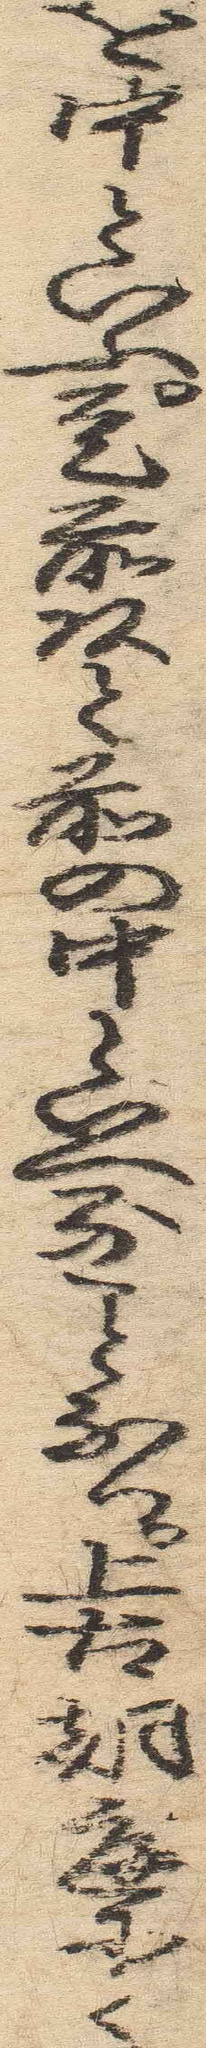を中といふ。是前頭と前の中といといへることなり。上古朝廷にて
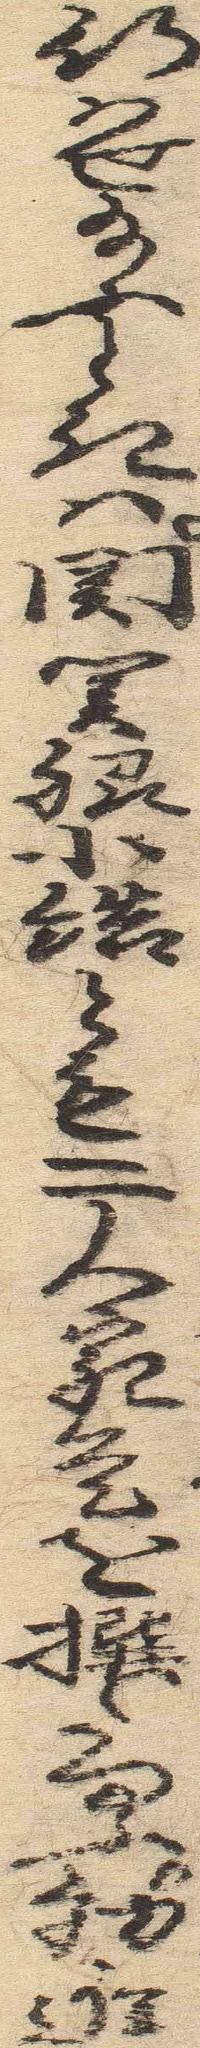行はせ給ふときは。関関脇小結とも二人宛是を撰たまふ。勧進
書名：古今相撲大全
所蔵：東京学芸大学附属図書館 国文学研究資料館
